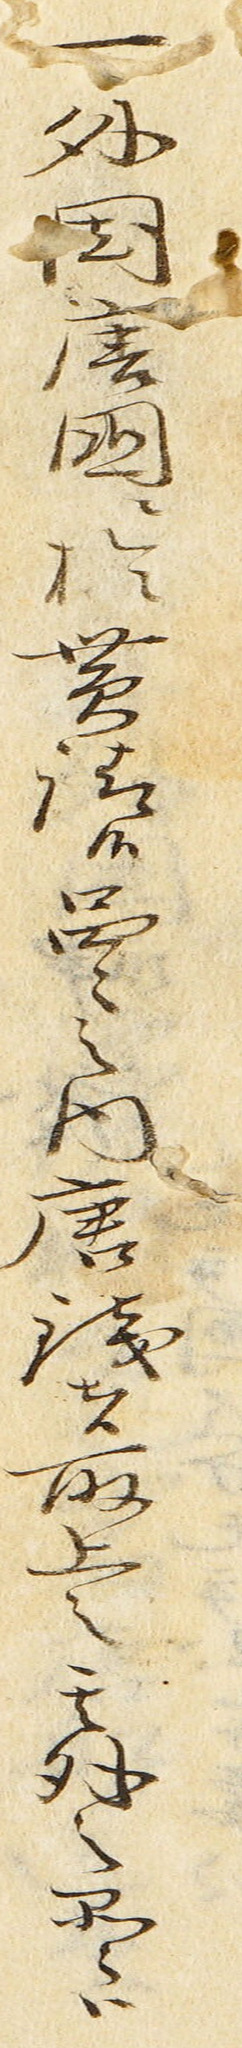一外国唐国に於貰請候品々之内唐銭は取上之其外之品々は
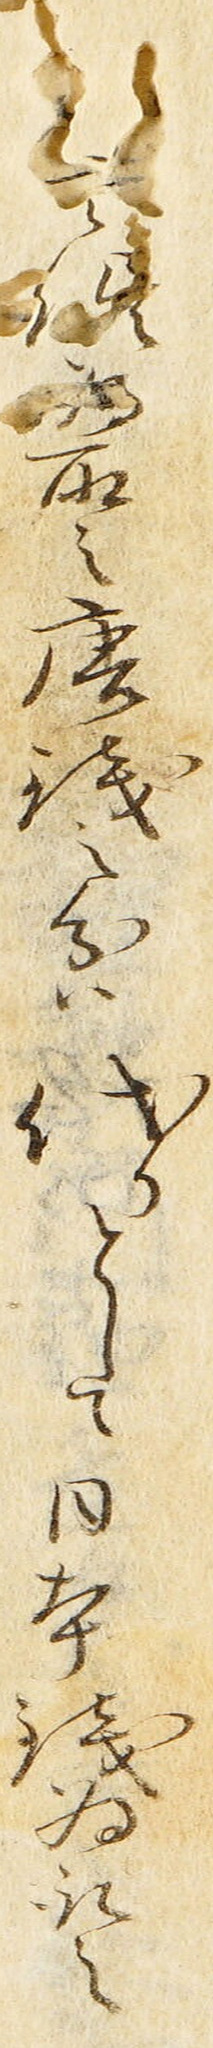其侭為取之唐銭之分は代りとして日本銭為取之
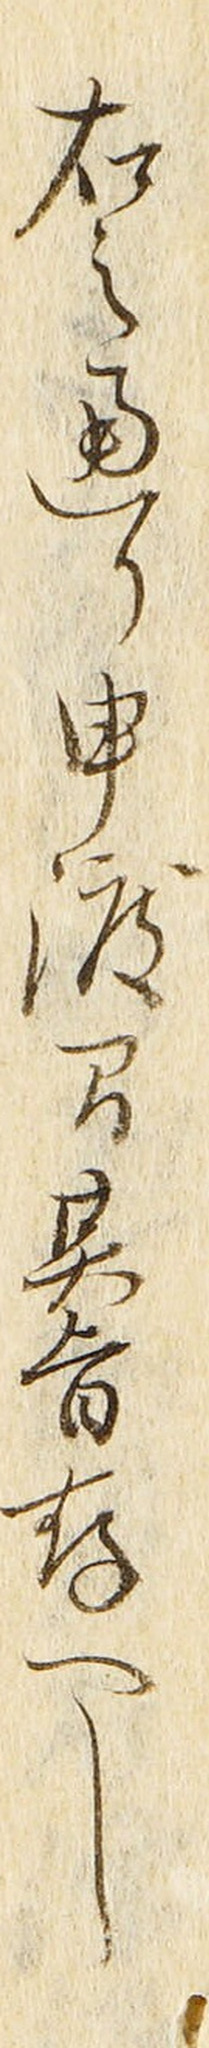右の通り申渡間其旨存へし
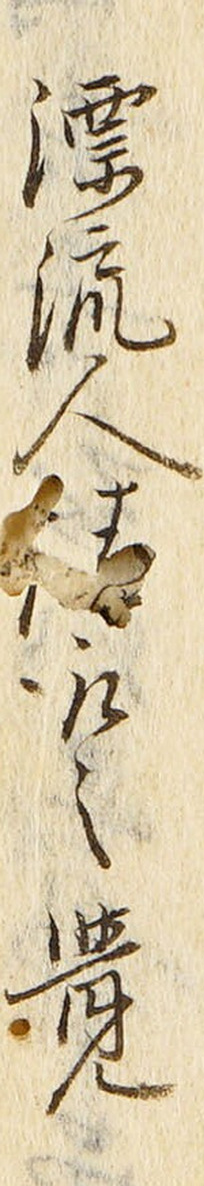漂流人請取之覚
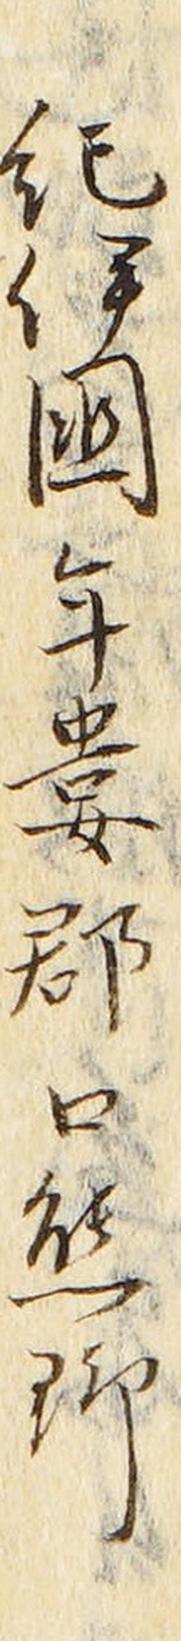紀伊国牟婁郡口熊野
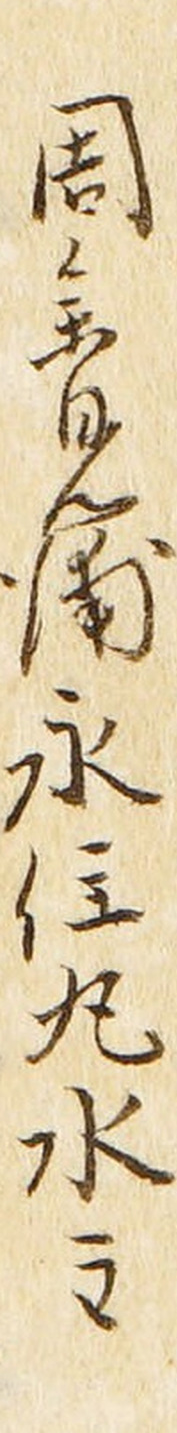周余見浦永住丸水主
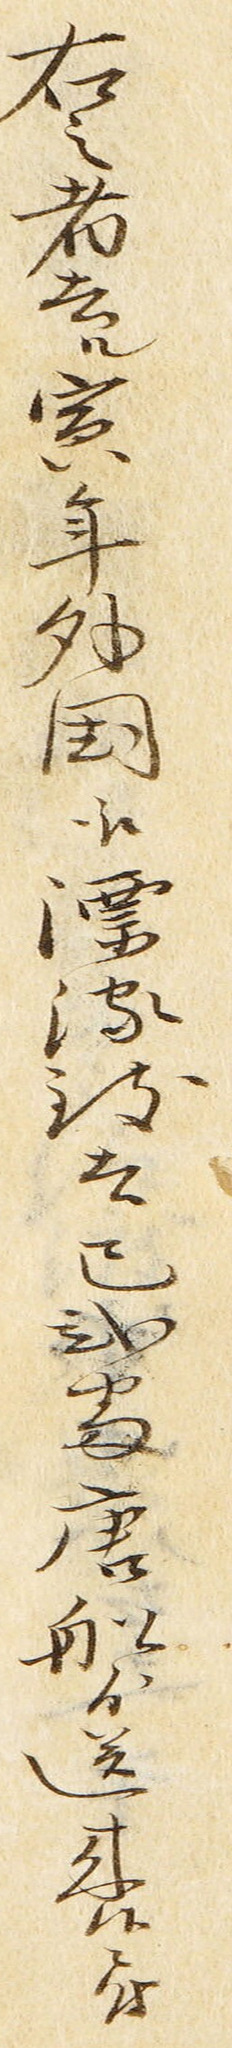右之者去る寅年外国江漂流致去巳弐叟唐船ゟ送来候に付
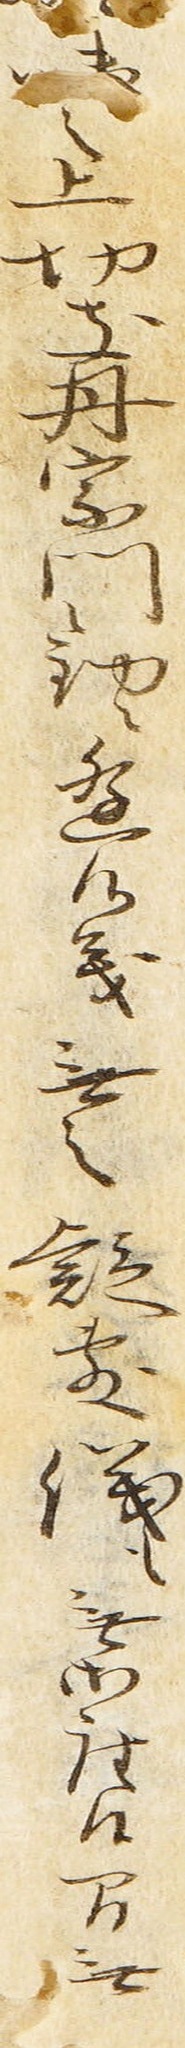御吟味之上切支丹宗門勧進候義無之疑敷儀も無御座候間無
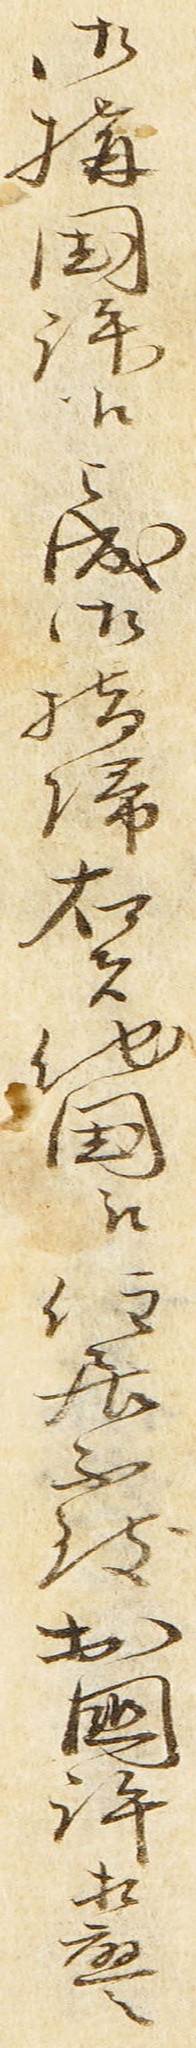御構国許江被成御指帰右は他国江住居不致お国許相応之
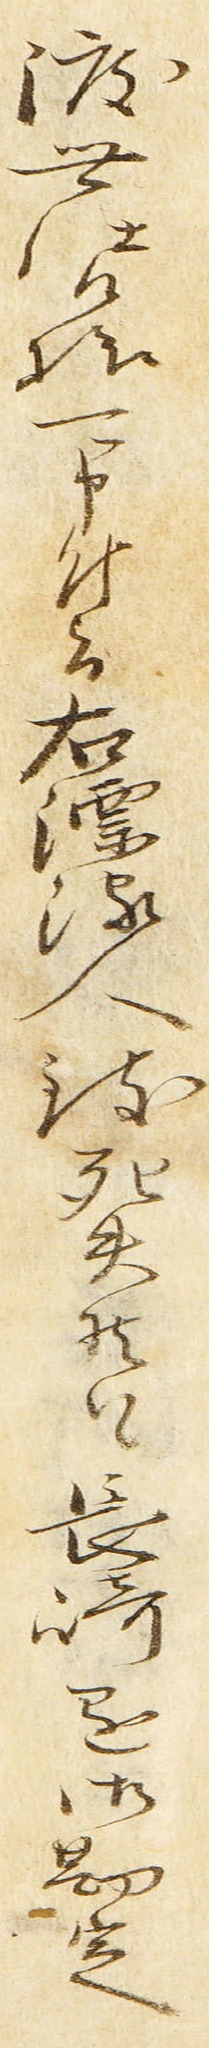渡無仕候様可申付旨右漂流人致死失候はは長崎を御勘定
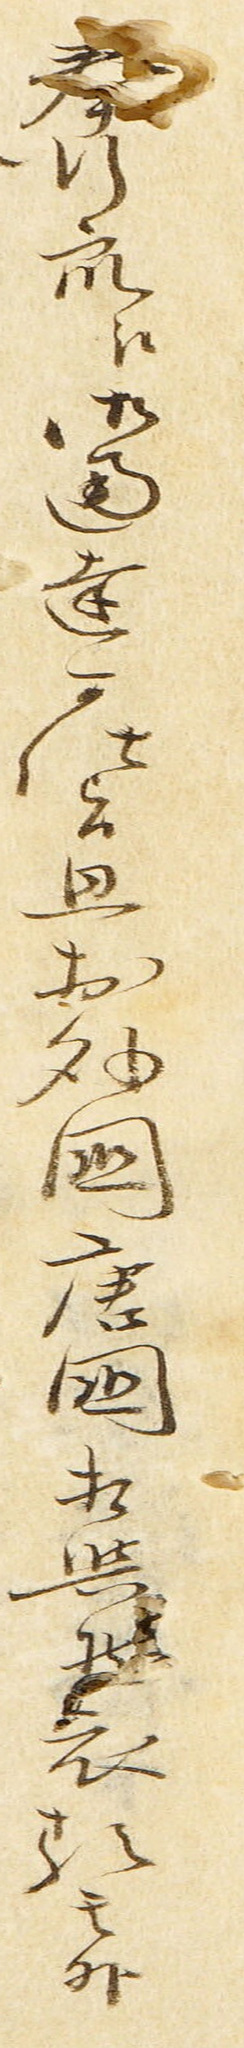奉行衆江御通達可仕旨且於外国唐国相与候衣類其外
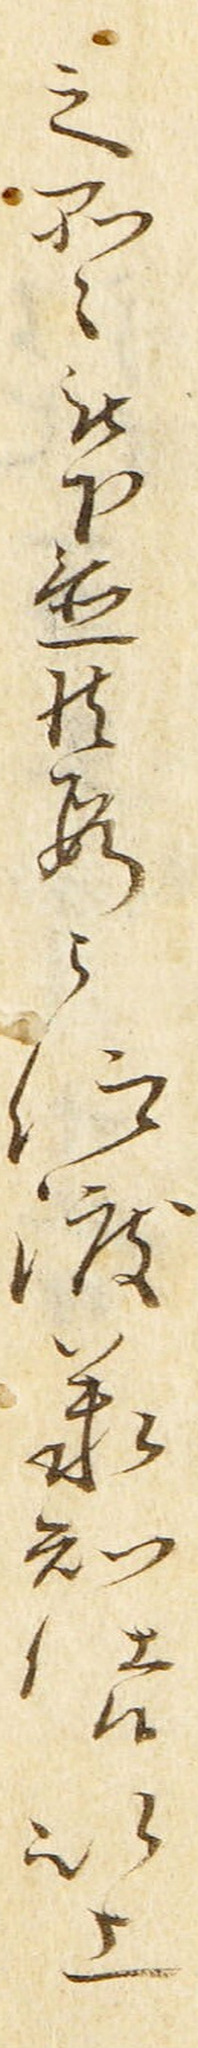之品々被下置候段被伝渡承知仕候以上

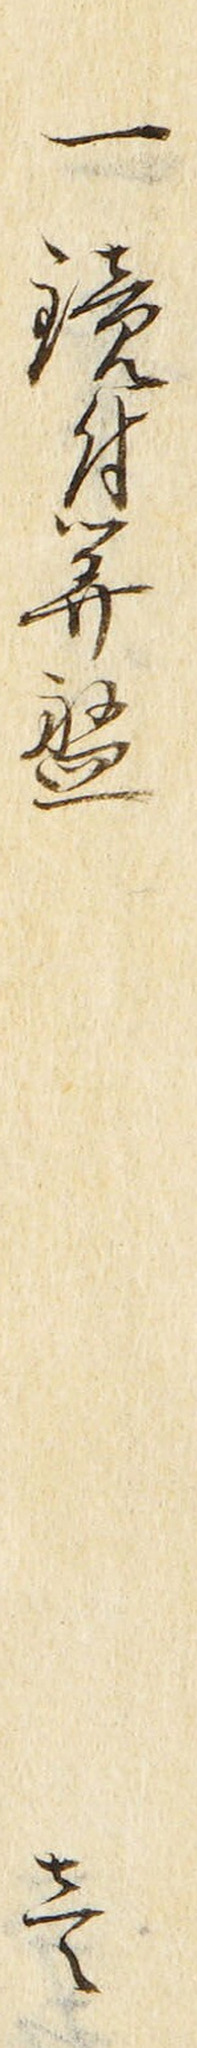一鏡付算盤壱
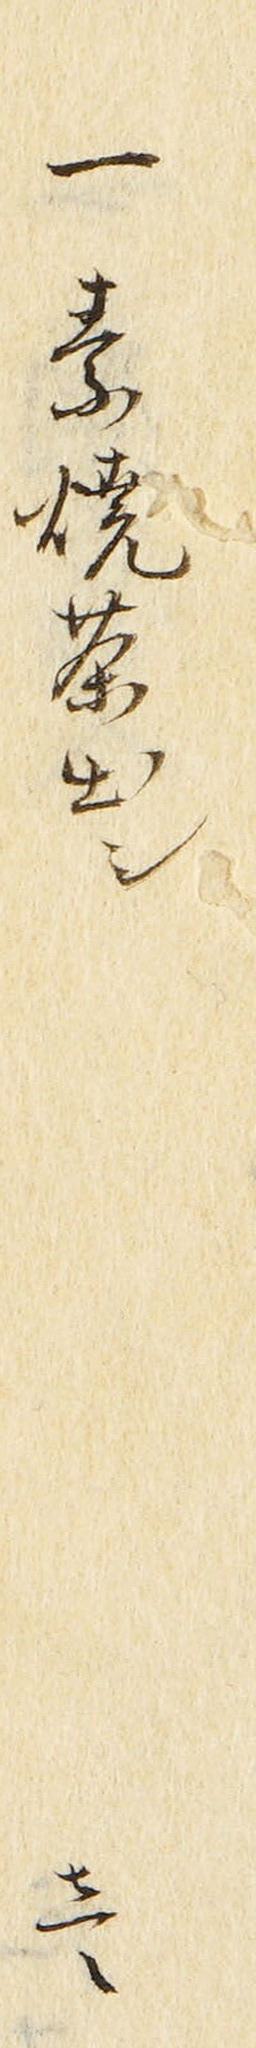一素焼茶出シ壱
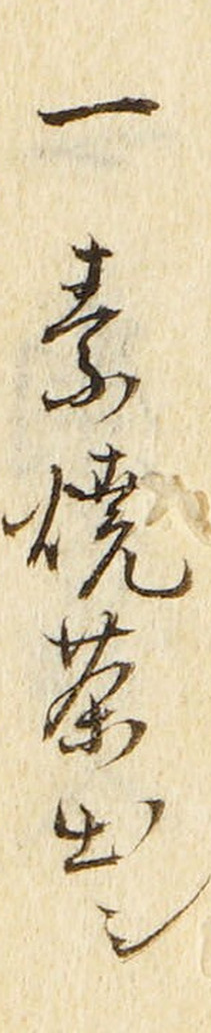一素焼茶出シ壱
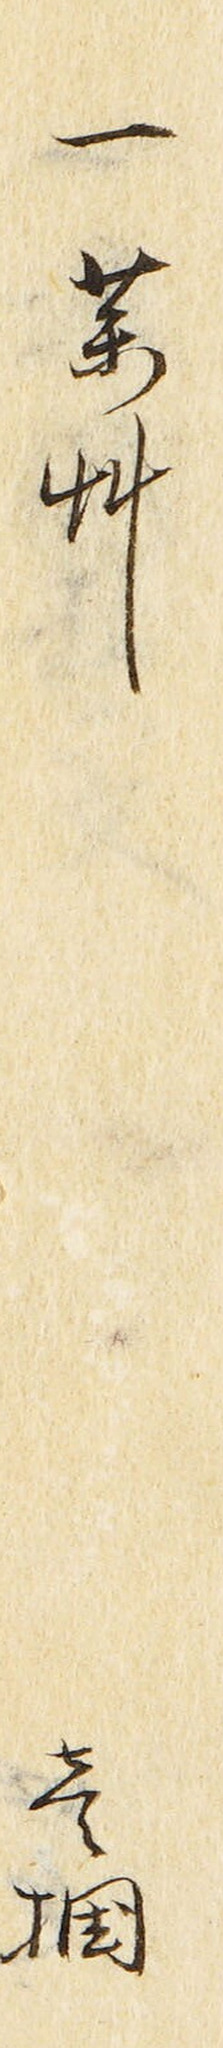一菜草壱掴
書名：漂流人弥市之記
